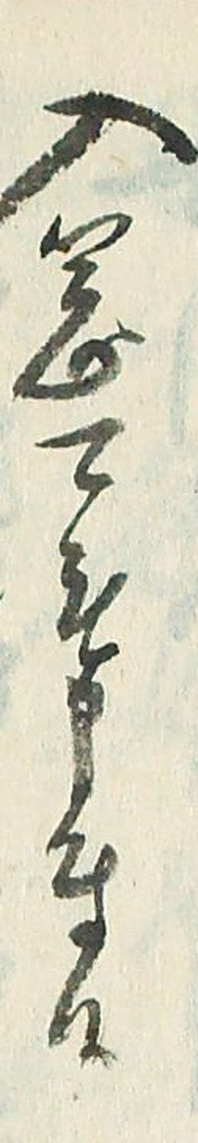入念可被申付候
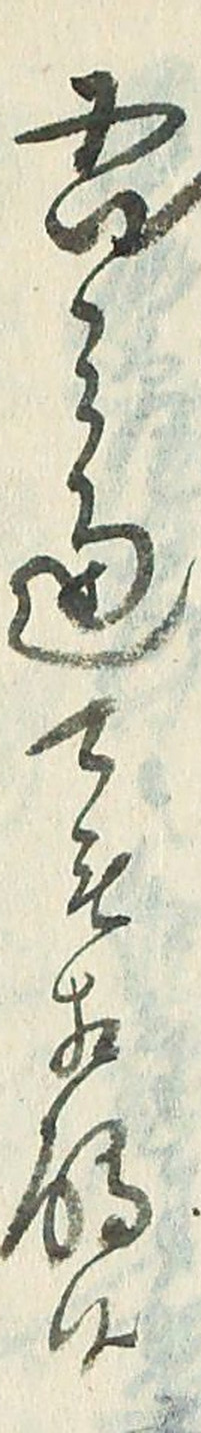右之通可被相触候
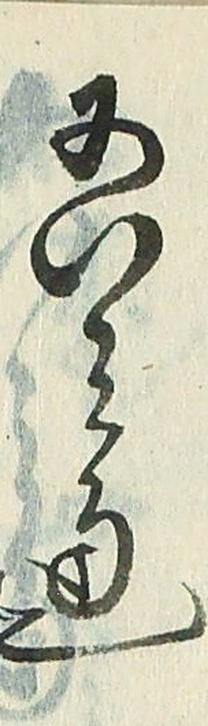右之通
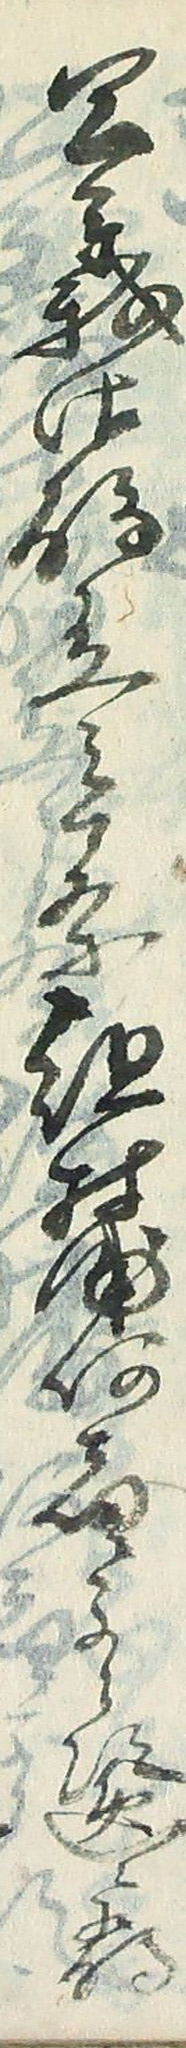公義御触有之候条組浦村何者によらす逸々相触
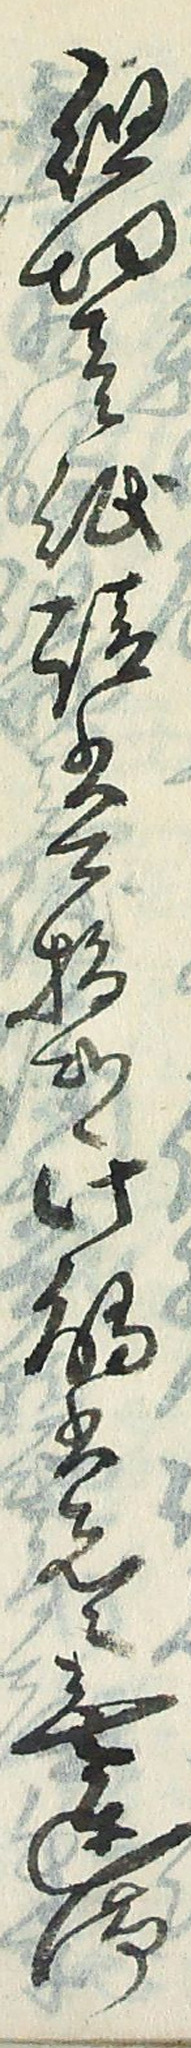組切壱紙請書可指出候此触書先々無遅滞
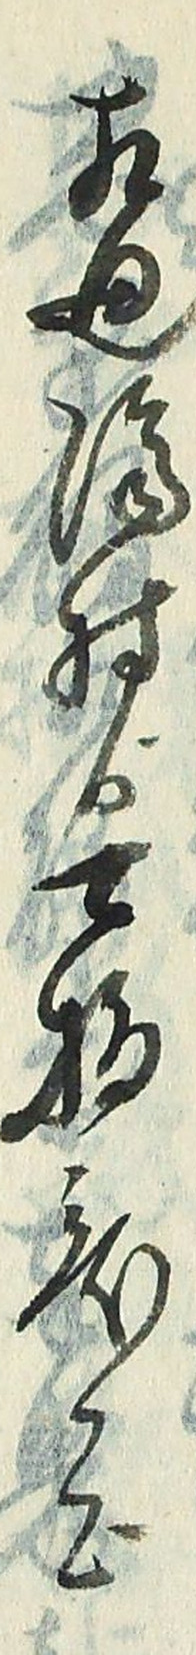相廻済村ゟ可指戻候以上
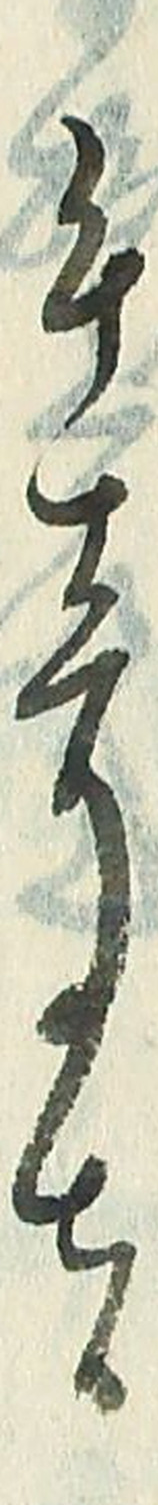午十二月七日
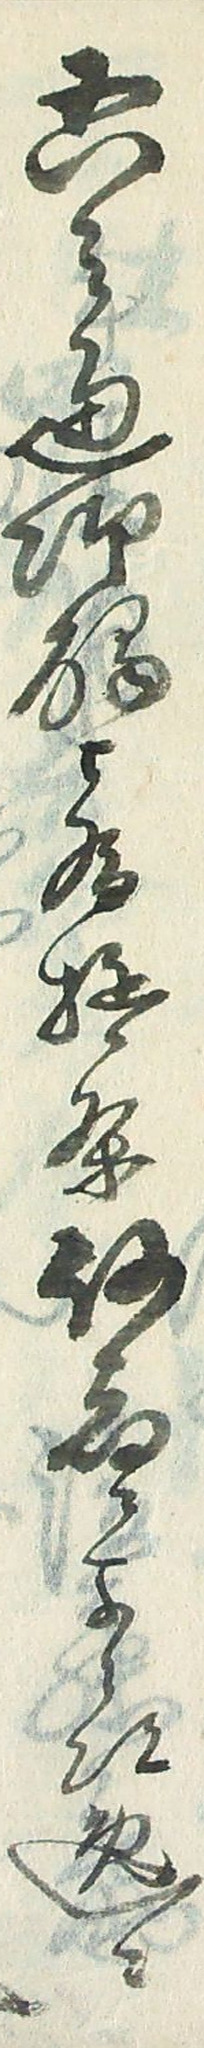右之通御触被為遊候条何者によらす逸々
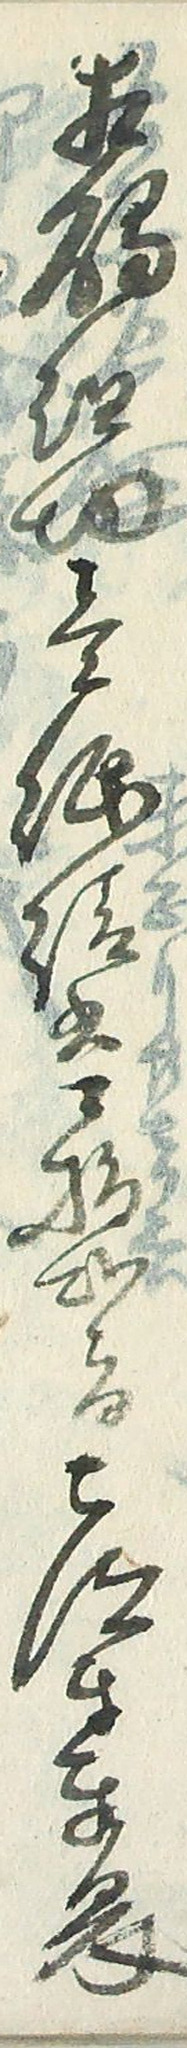相触組切壱紙請書可指出旨被仰付奉畏
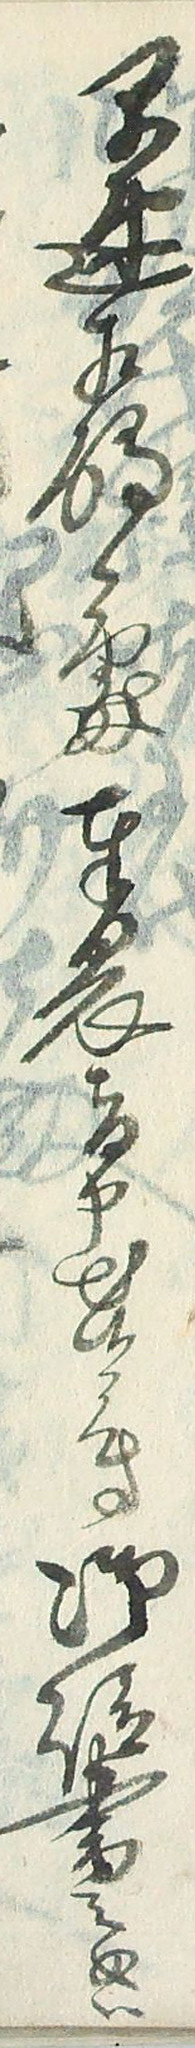早速相触候処奉畏旨申出候に付御請書之義は
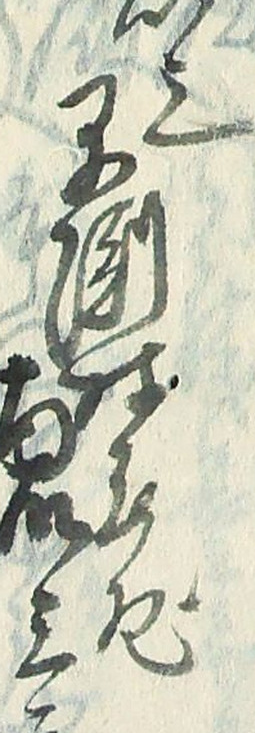早渕村庄屋

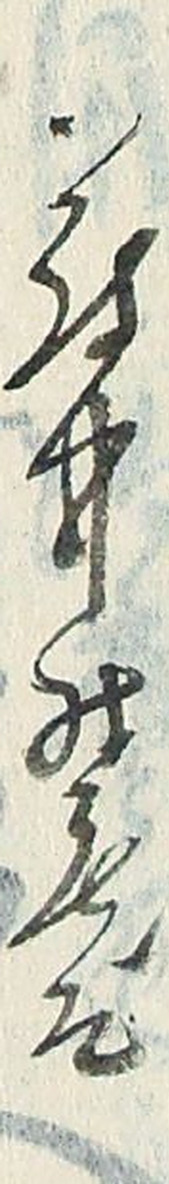府中村庄屋
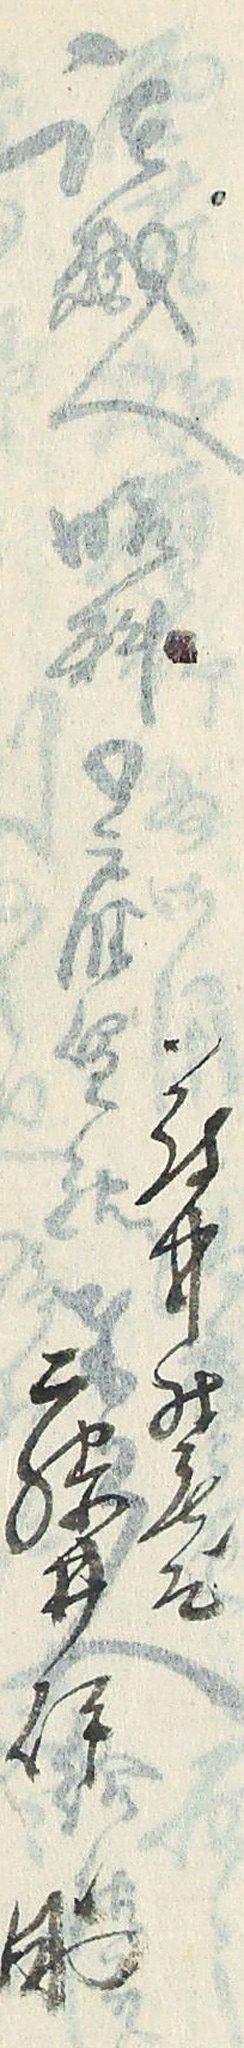藤井伊助
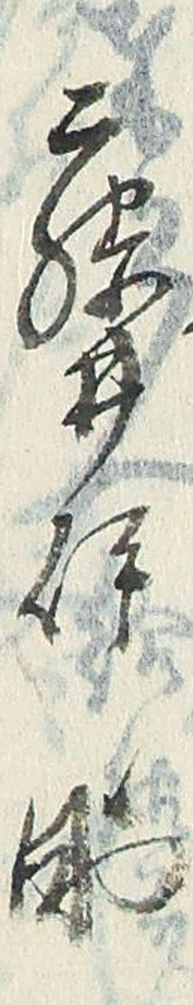藤井伊助
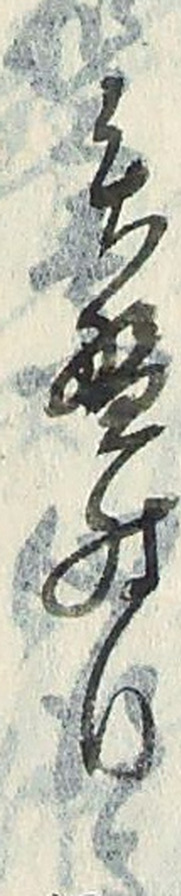矢野村同
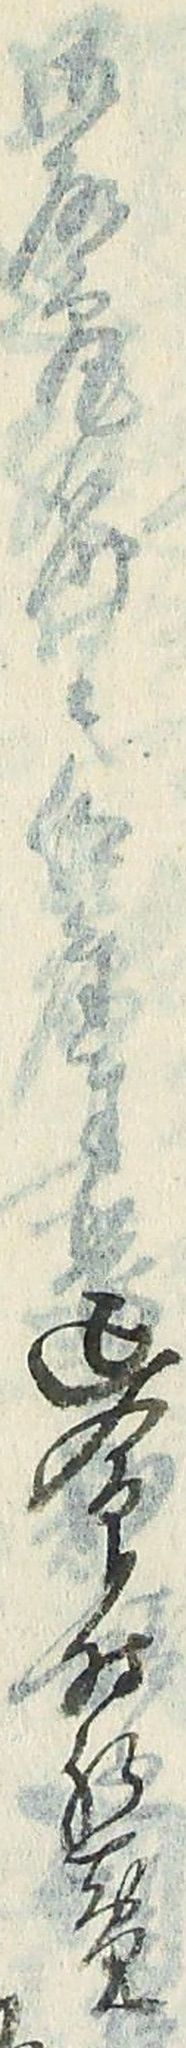延命村肝煎
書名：諸御用御□受書控
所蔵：鳴門教育大学 Naruto University of Education
